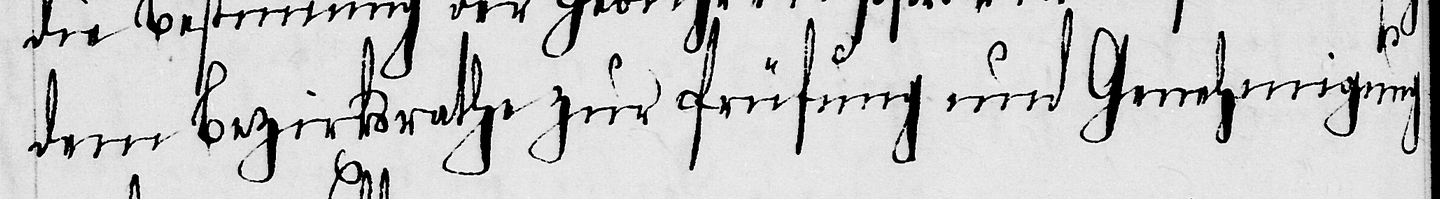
dem Bezirksrathe zur Prüfung und Genehmigung
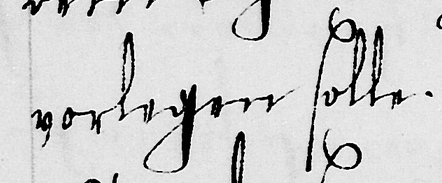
vorlegen soll¬
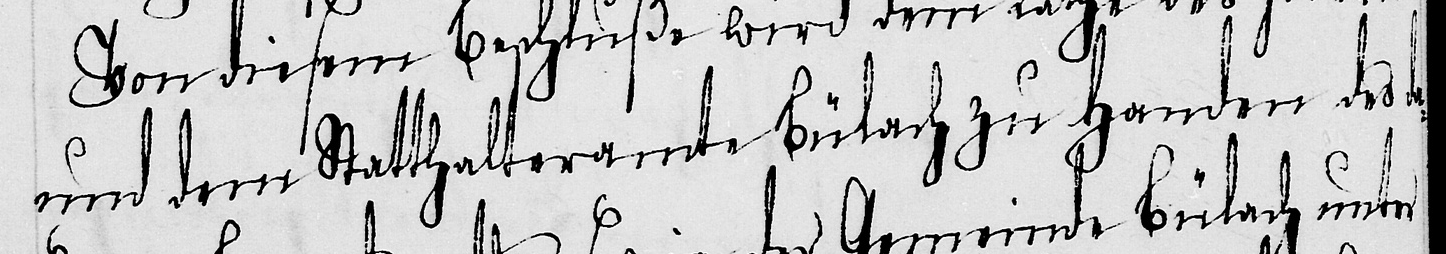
und dem Statthalteramte Bülach zu Handen des
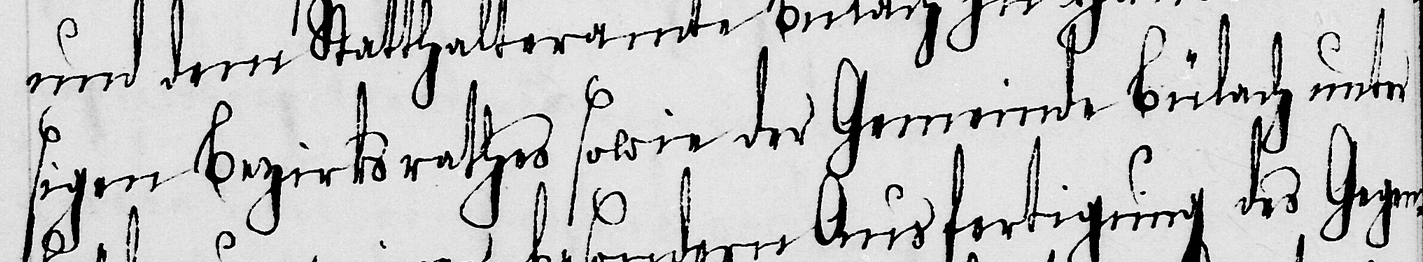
sigen Bezirksrathes sowie der Gemeinde Bülach unt¬
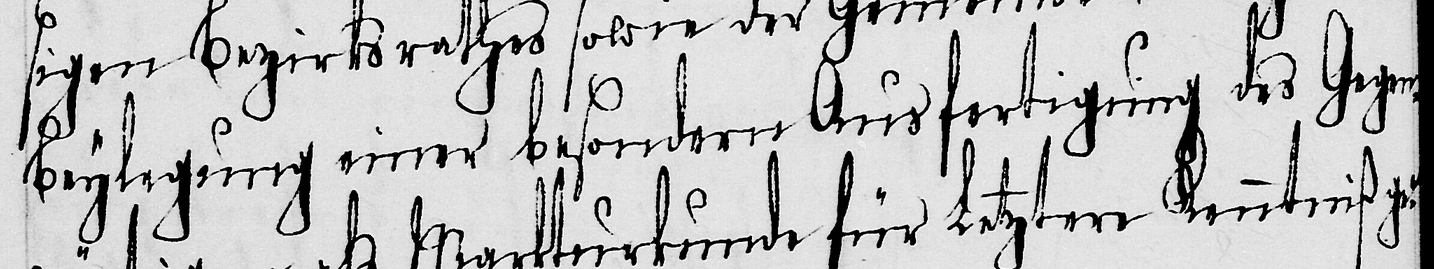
Beylegung einer besondern Ausfertigung des Gege¬
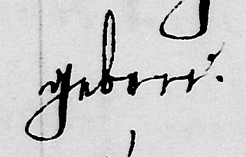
egeben.
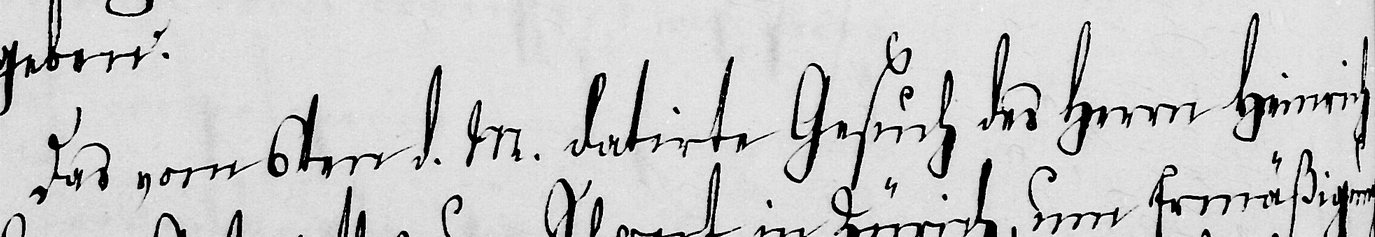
Das vom 6ten d. M. datirte Gesuch des Herrn Hein¬
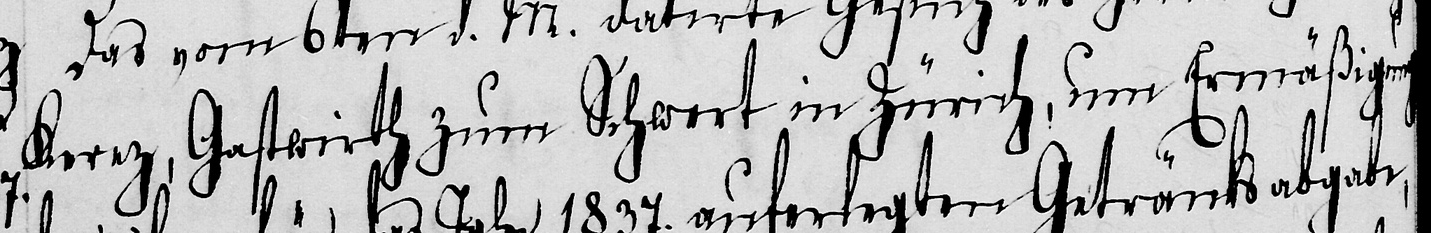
Kerez, Gastwirth zum Schwert in Zürich, um Ermäßigung
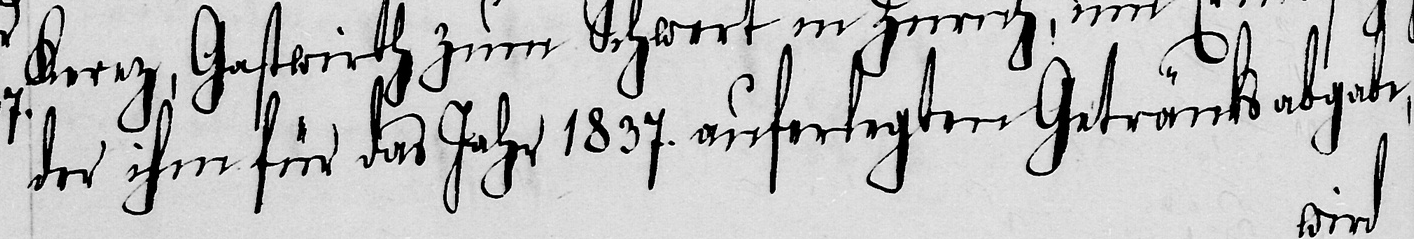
der ihm für das Jahr 1837. auferlegten Getränksabgab¬
